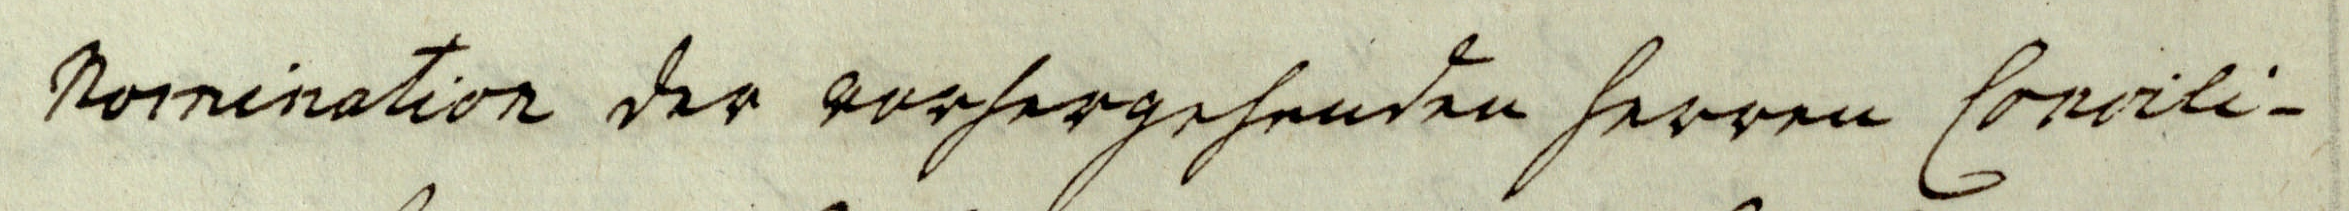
Nomination der vorhergehenden Herren Concili¬
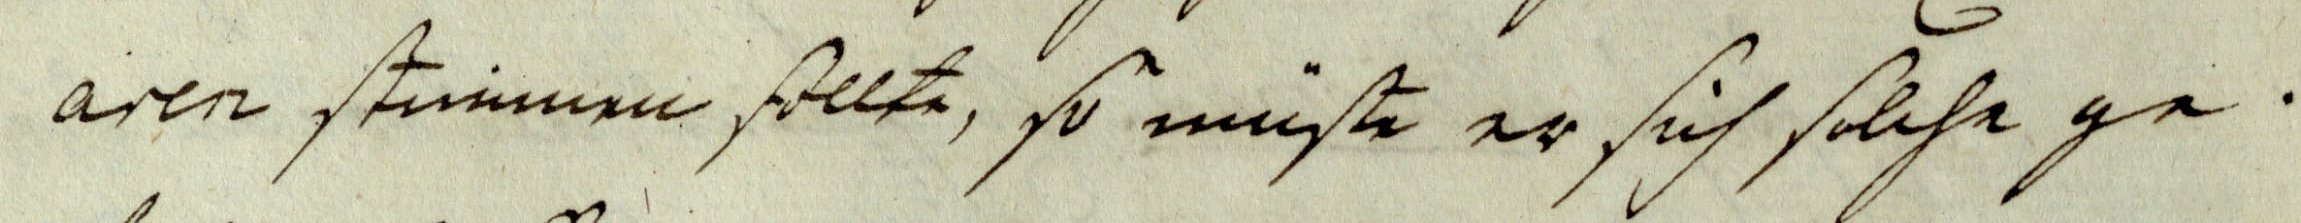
aren stimmen sollte, so müsste er sich solche ge¬
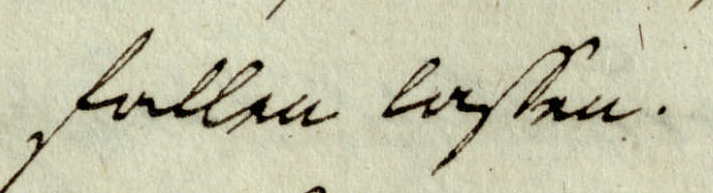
fallen lassen.
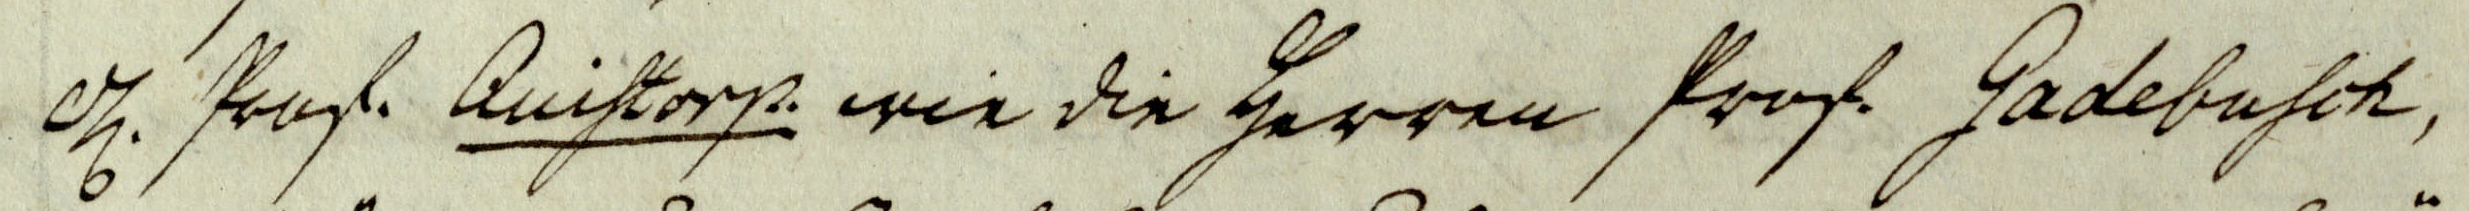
dh. Prof. Quistorp. wie die Herren Prof. Gadebusch,
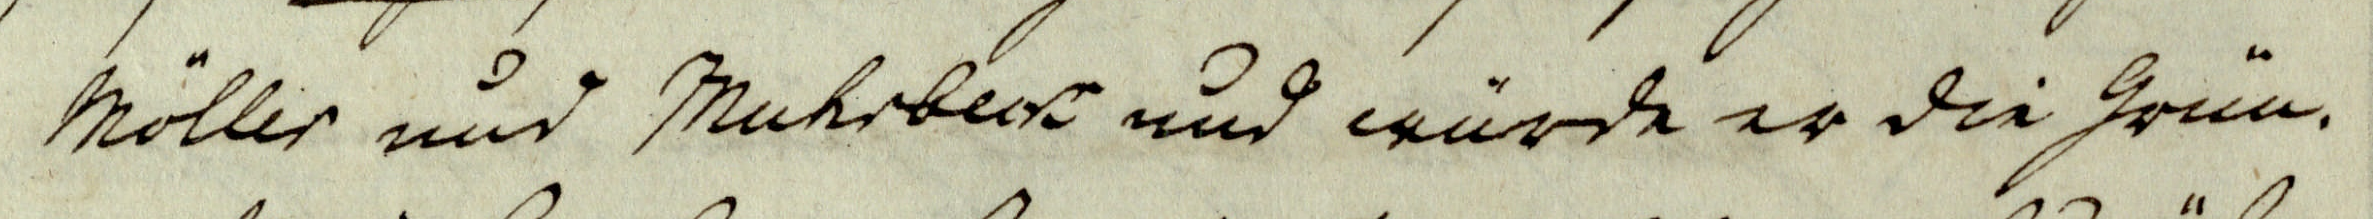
Möller und Muhrbeck und würde er die Grün¬
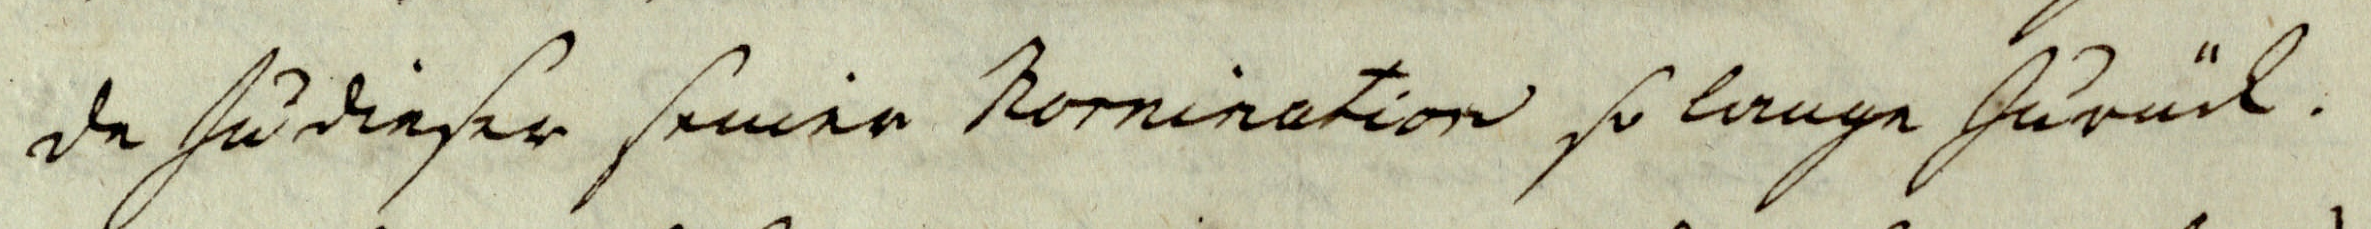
de zu dieser seiner Nomination so lange zurück¬
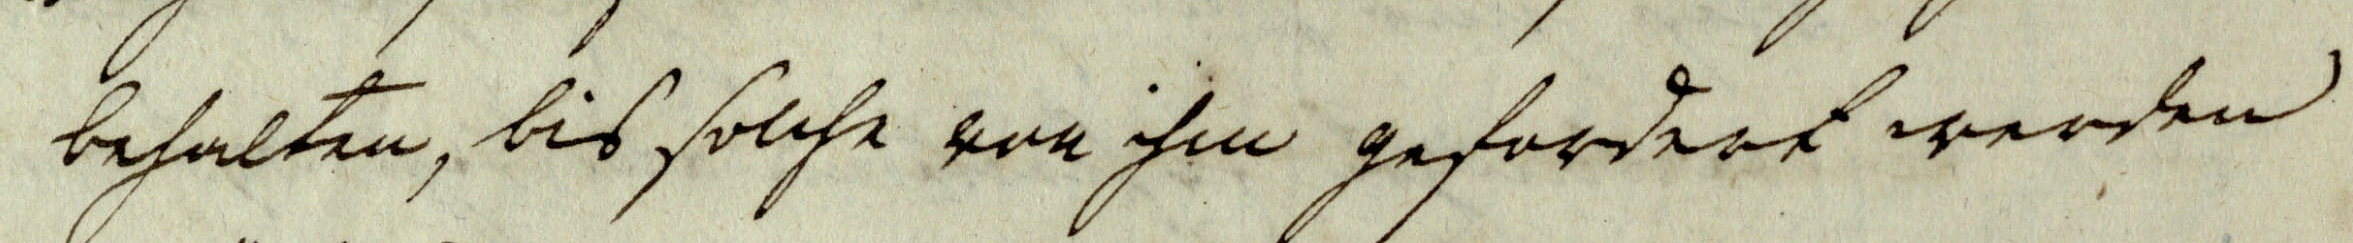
behalten, bis solche von ihm gefordert werden
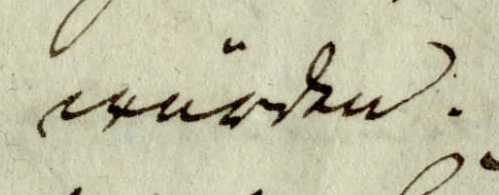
würden.
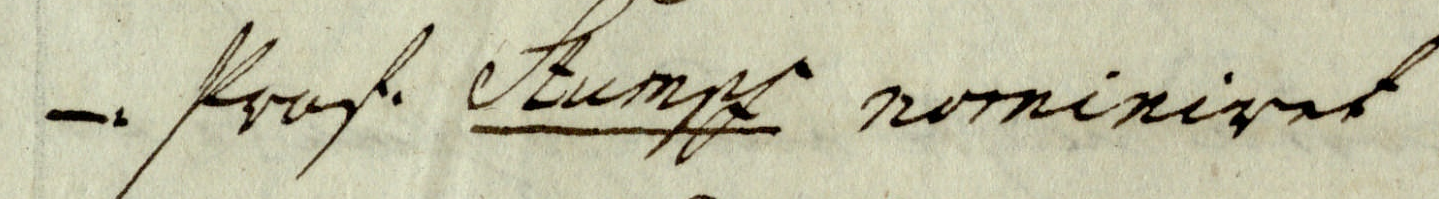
— " Prof. Stumpf nominirt
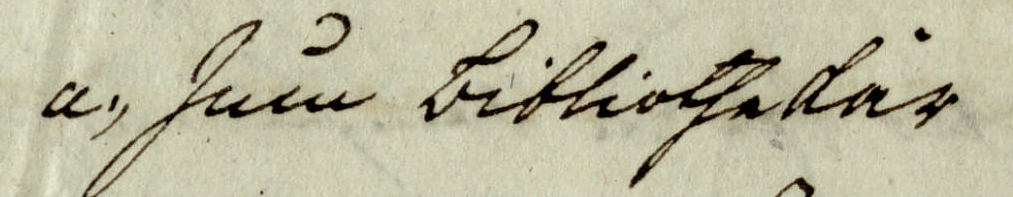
a., zum Bibliothekär
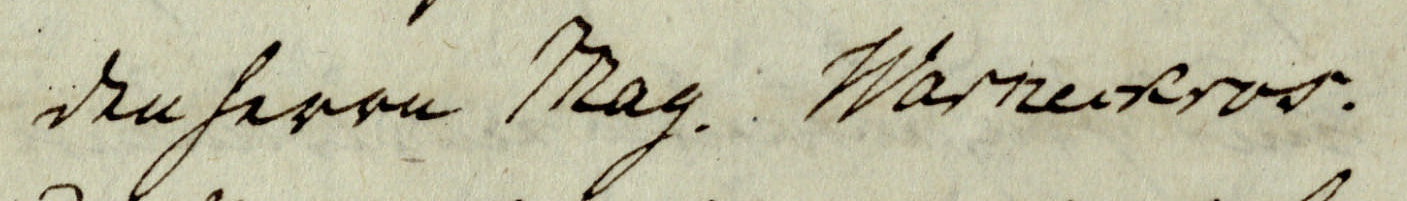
den Herrn Mag. Warneckros.
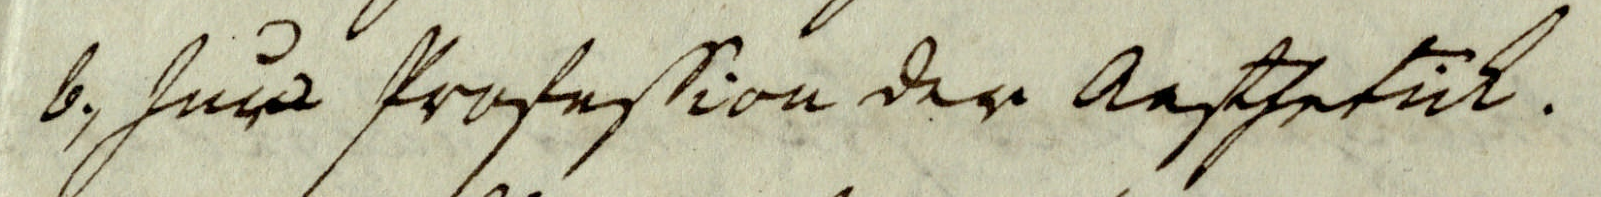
b., zur Profession der Aesthetick.
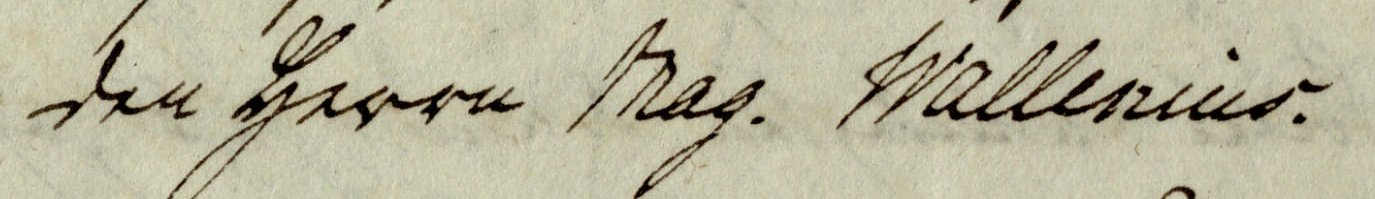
den Herrn Mag. Wallenius.
